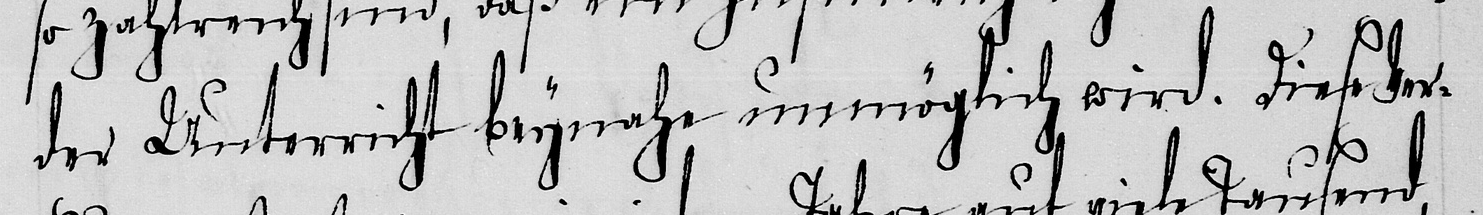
der Unterricht beynahe unmöglich wird. Diese Ver¬
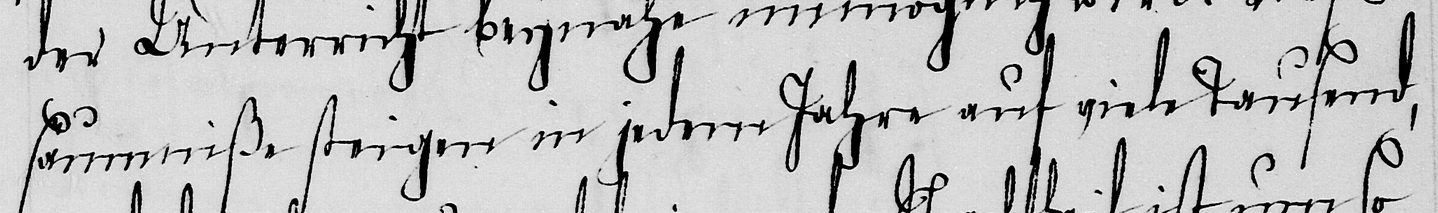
säumniße steigen in jedem Jahre auf viele Tausend,
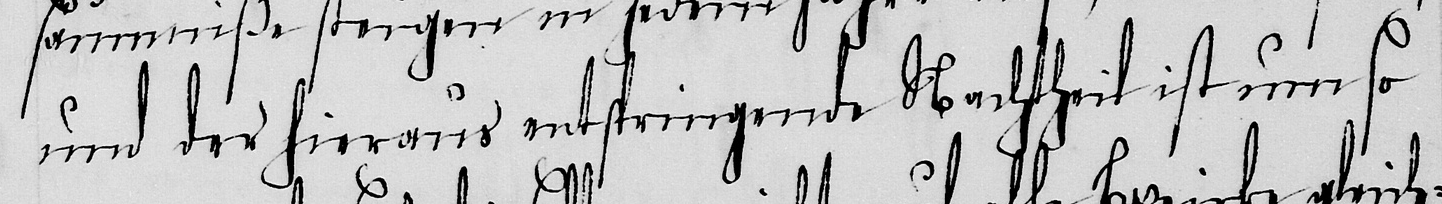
und der hieraus entspringende Nachtheil ist um so
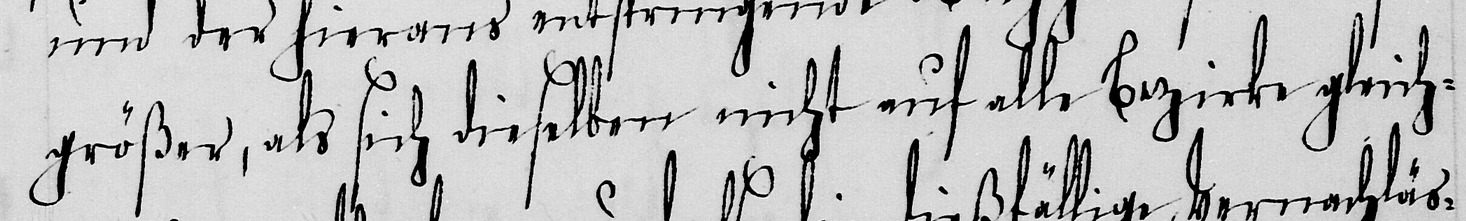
größer, als sich dieselben nicht auf alle Bezirke gleich¬
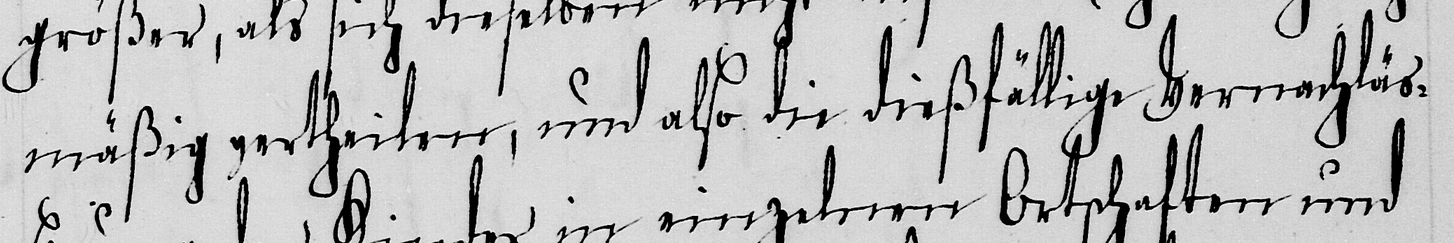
mäßig vertheilen, und also die dießfällige Vernachläß¬
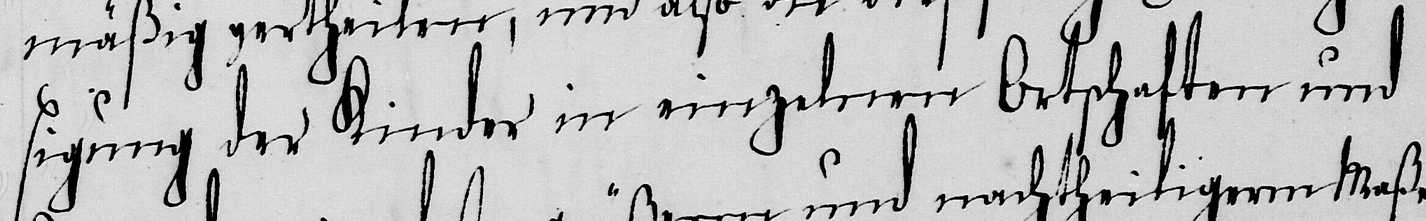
igung der Kinder in einzelnen Ortschaften und
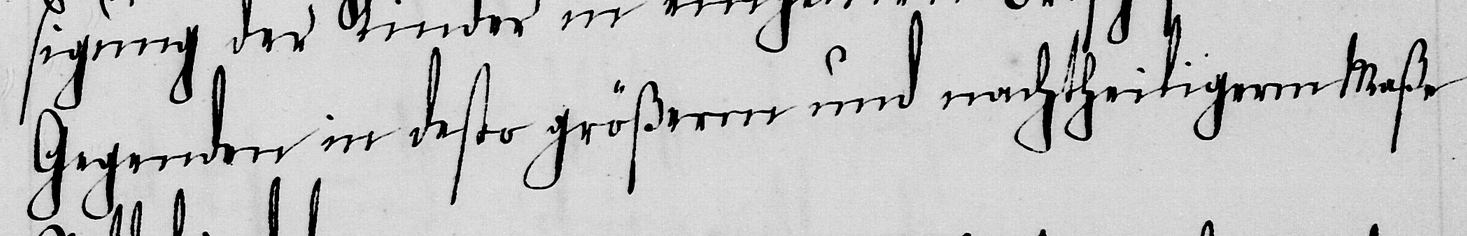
Gegenden in desto größerm und nachtheiligerm Maße
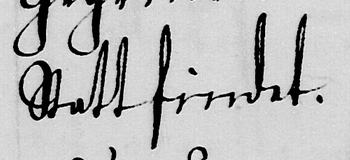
Statt findet.
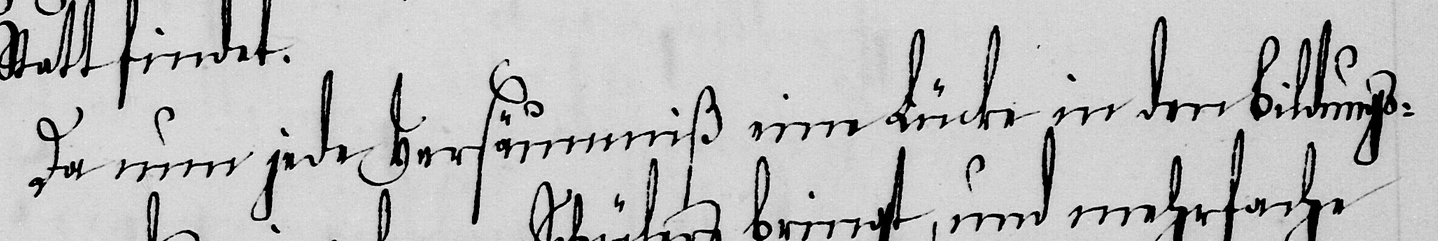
Da nun jede Versäumniß eine Lücke in den Bildungs¬
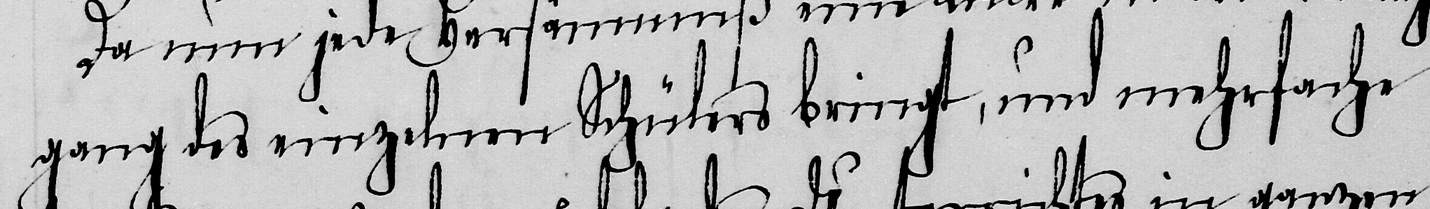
gang des einzelnen Schülers bringt, und mehrfache
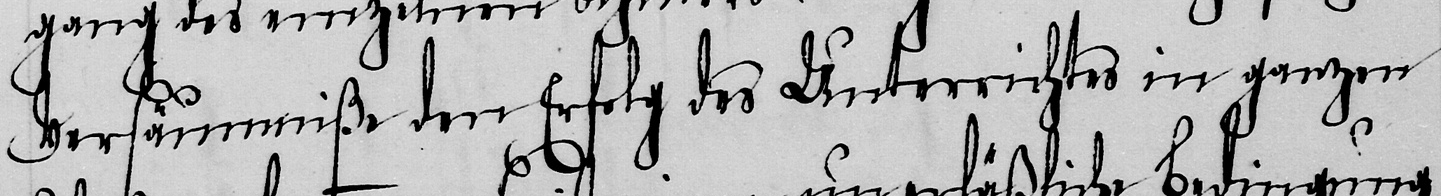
Versäumniße den Erfolg des Unterrichtes in ganzen
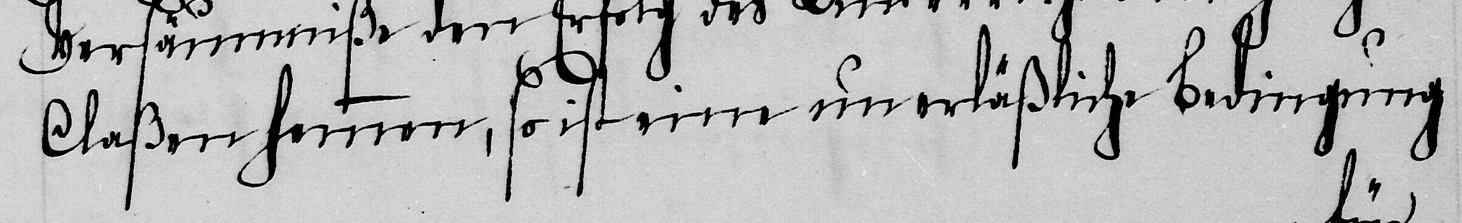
Claßen hemmen, so ist eine unverläßliche Bedingung
